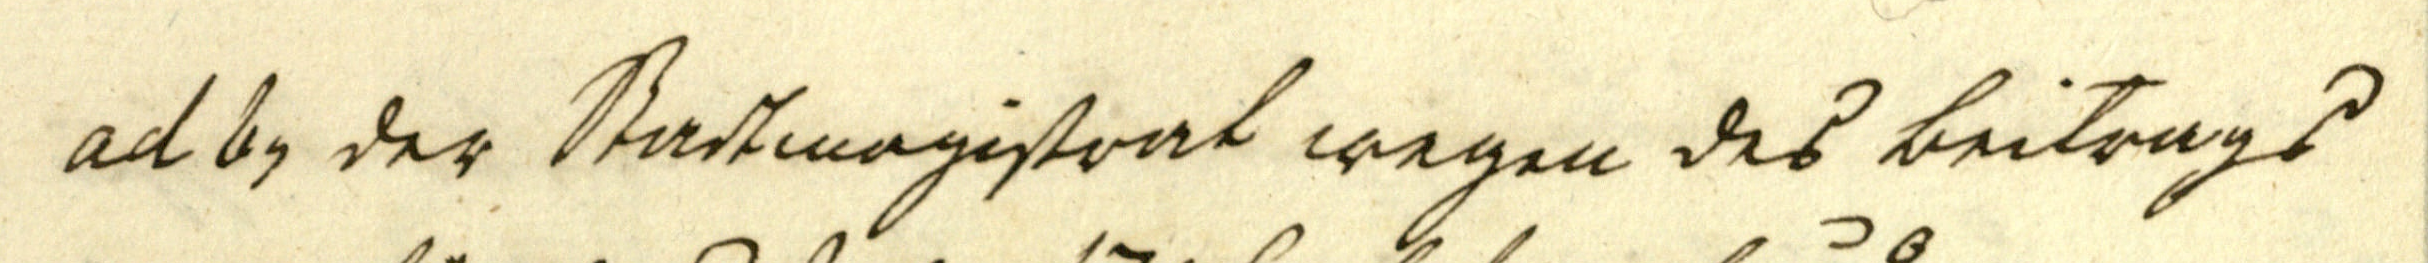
ad b., der Stadtmagistrat wegen des Beitrags
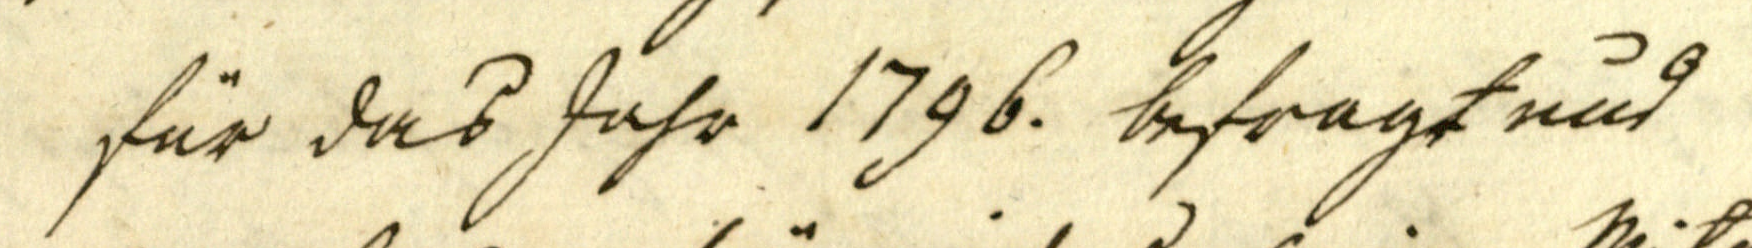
für das Jahr 1796. befragt und
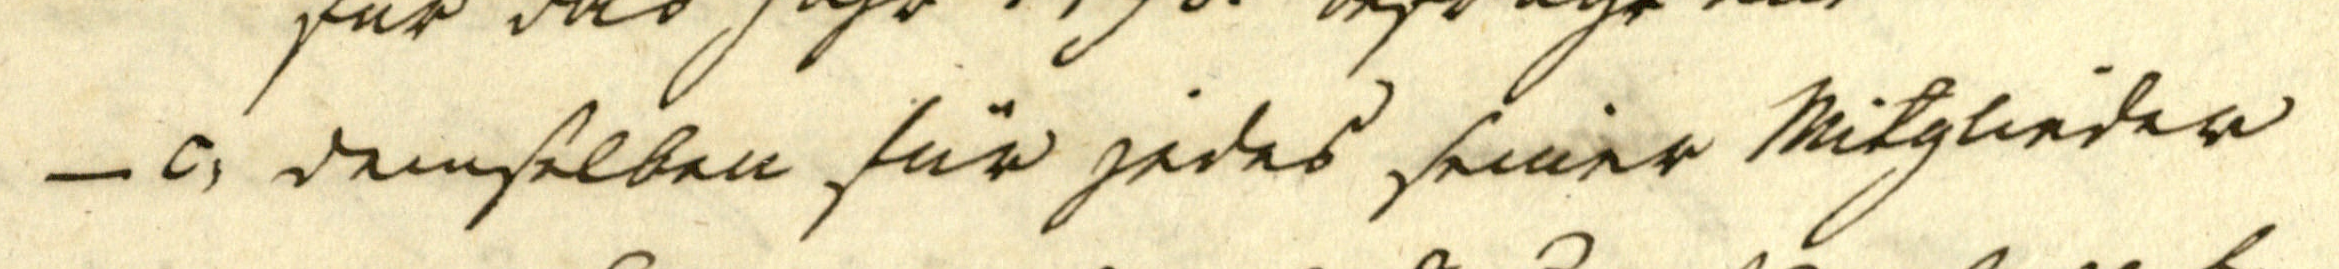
c, demselben für jedes seiner Mitglieder
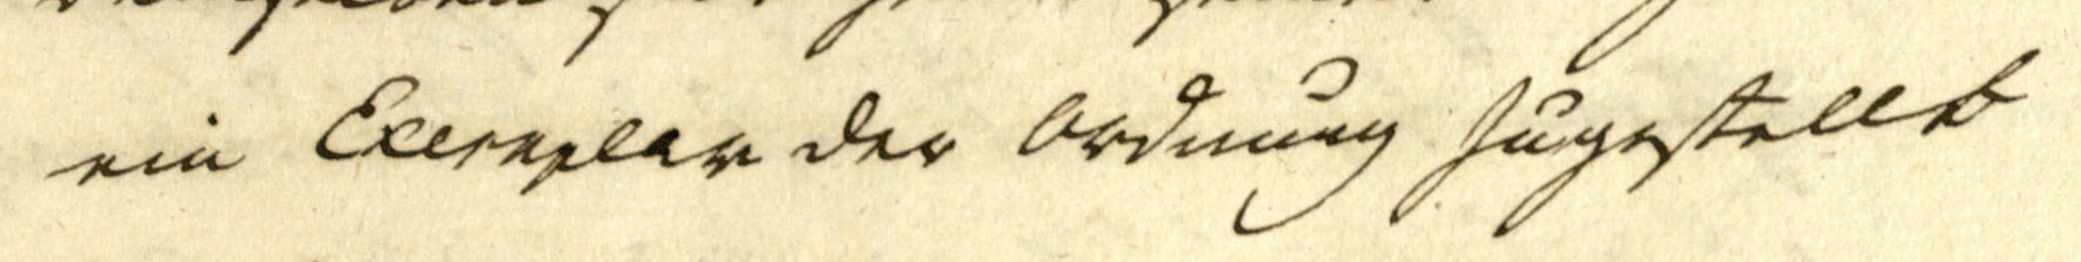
ein Exemplar der Ordnung zugestellt
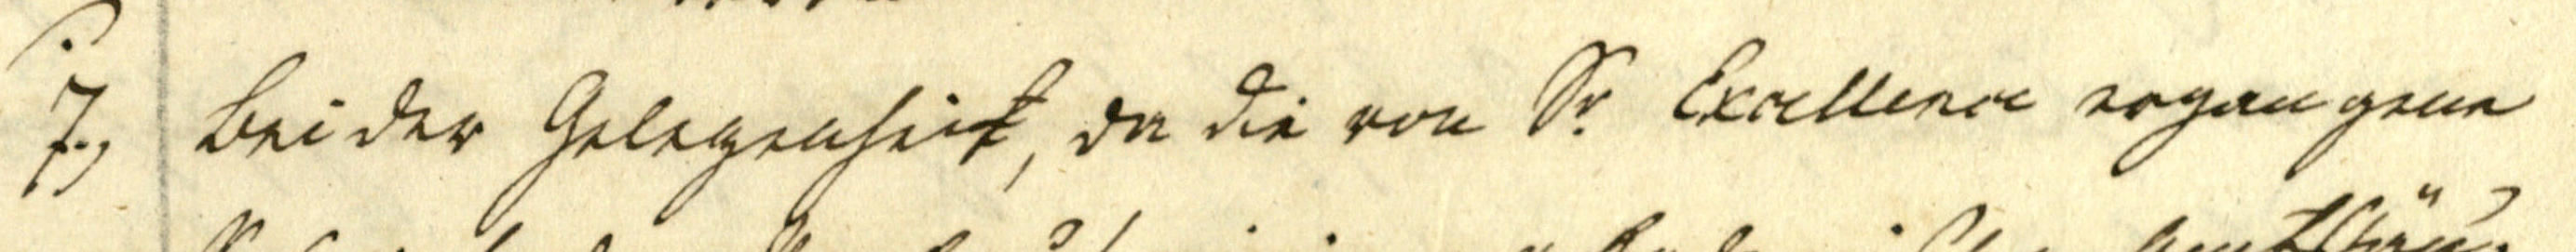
7., Bei der Gelegenheit, da die von Sr Excellence ergangene
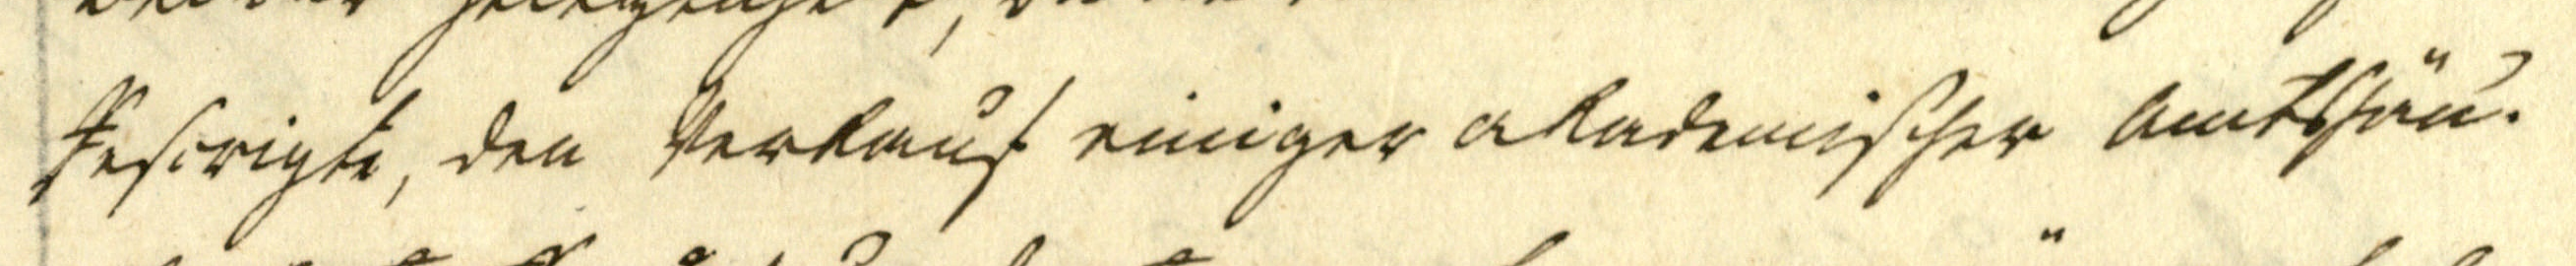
Rescripte, den Verkauf einiger akademischer Amtshäu¬
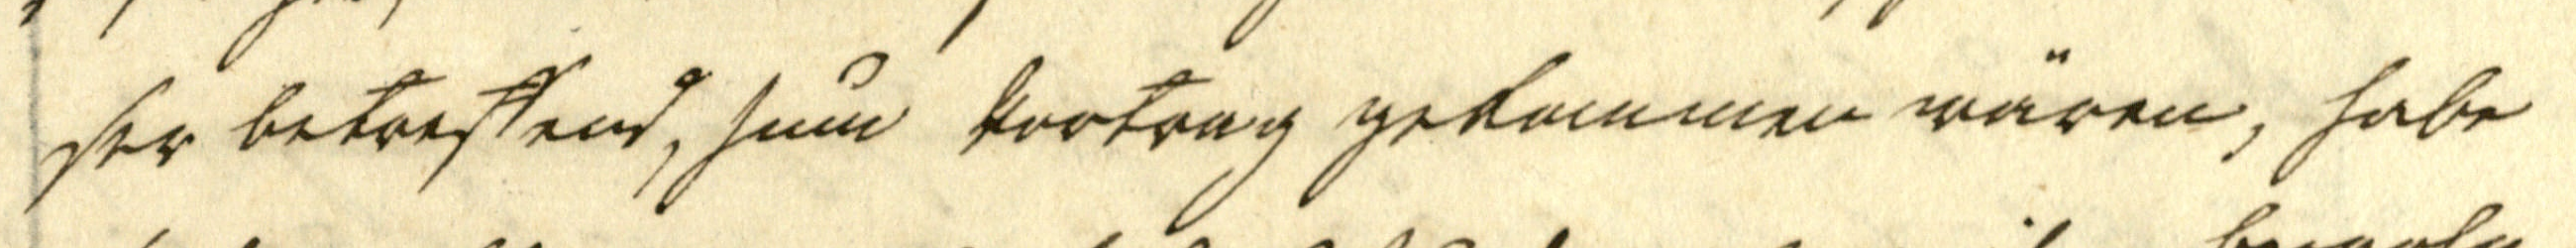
der betreffend, zum Vortrag gekommen wären, habe
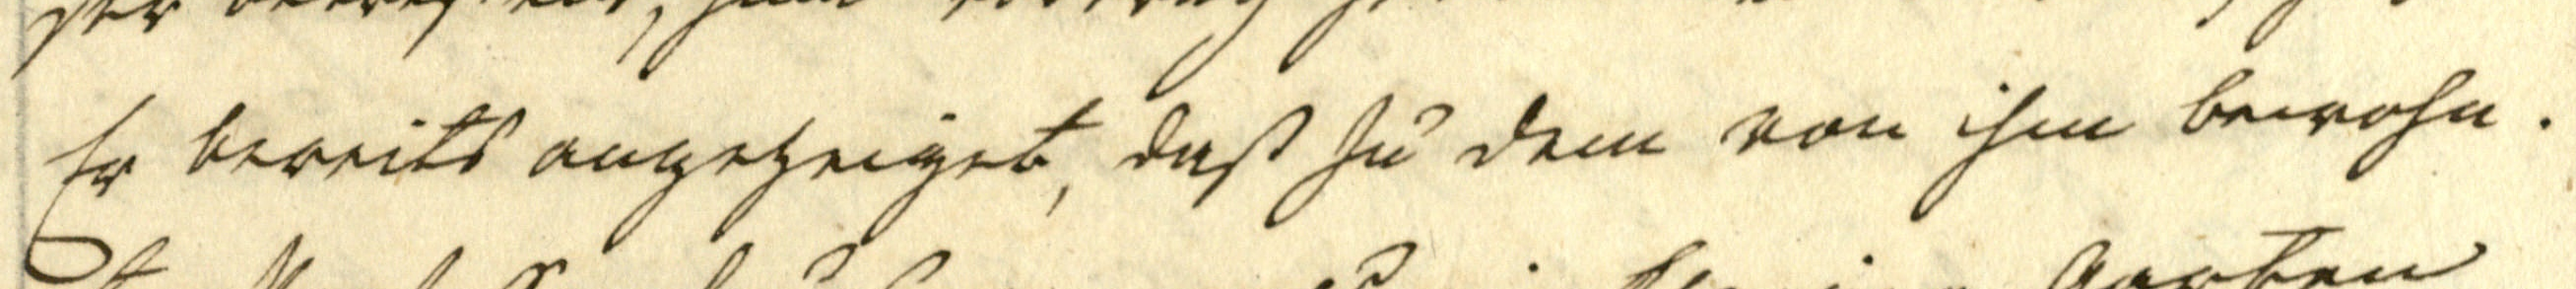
Er bereits angezeiget, daß zu dem von ihm bewohn-
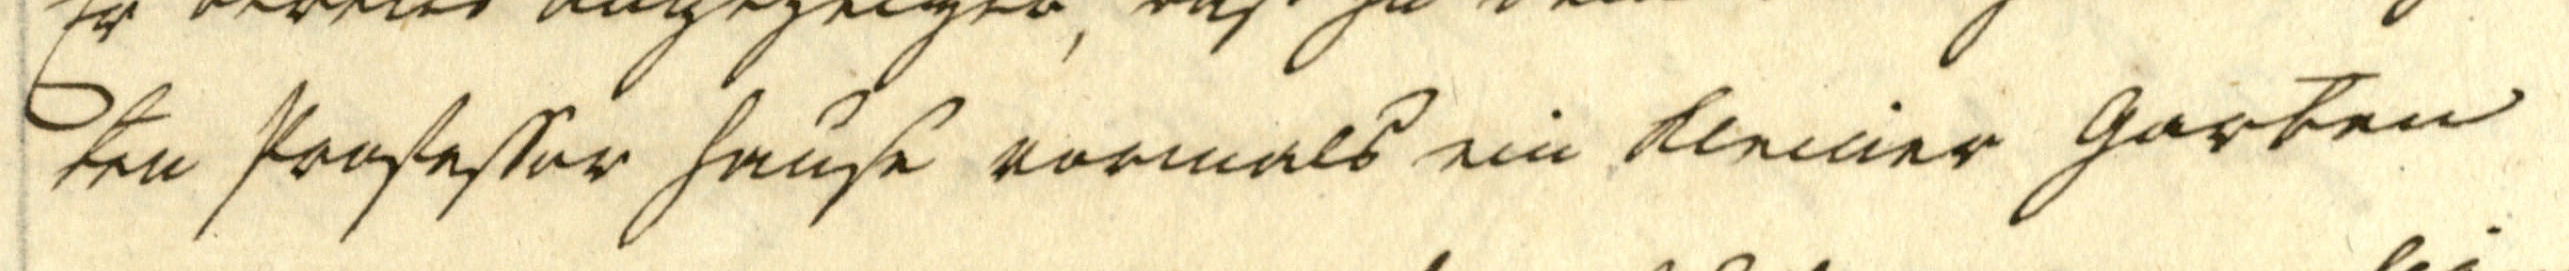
ten Professor hause vormals ein kleiner Garten
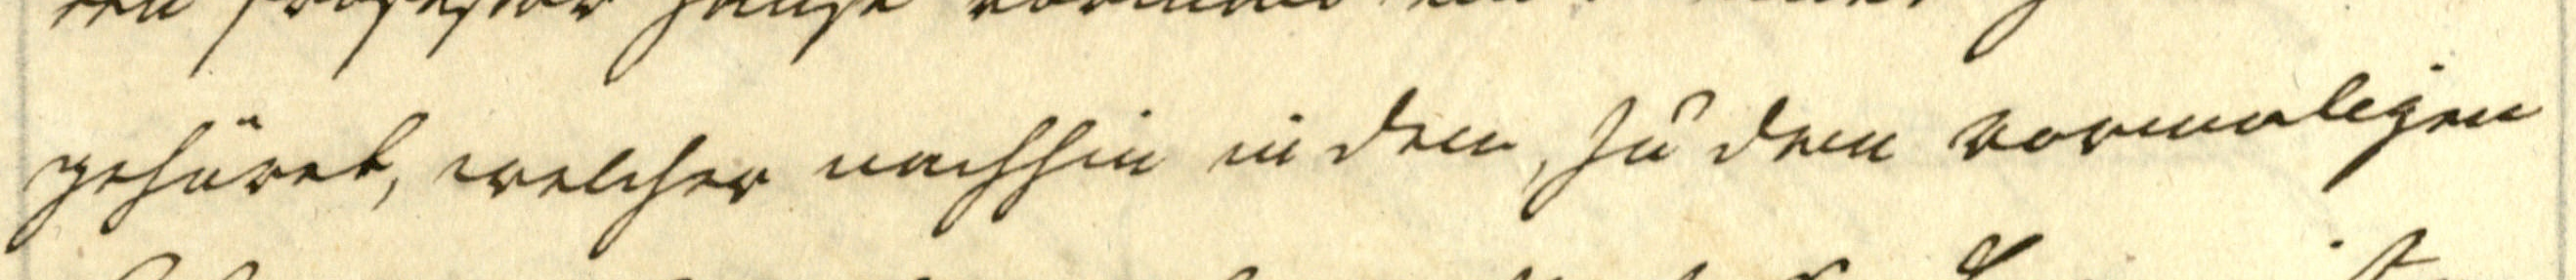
gehöret, welcher nachhin in dem zu dem vormaligen
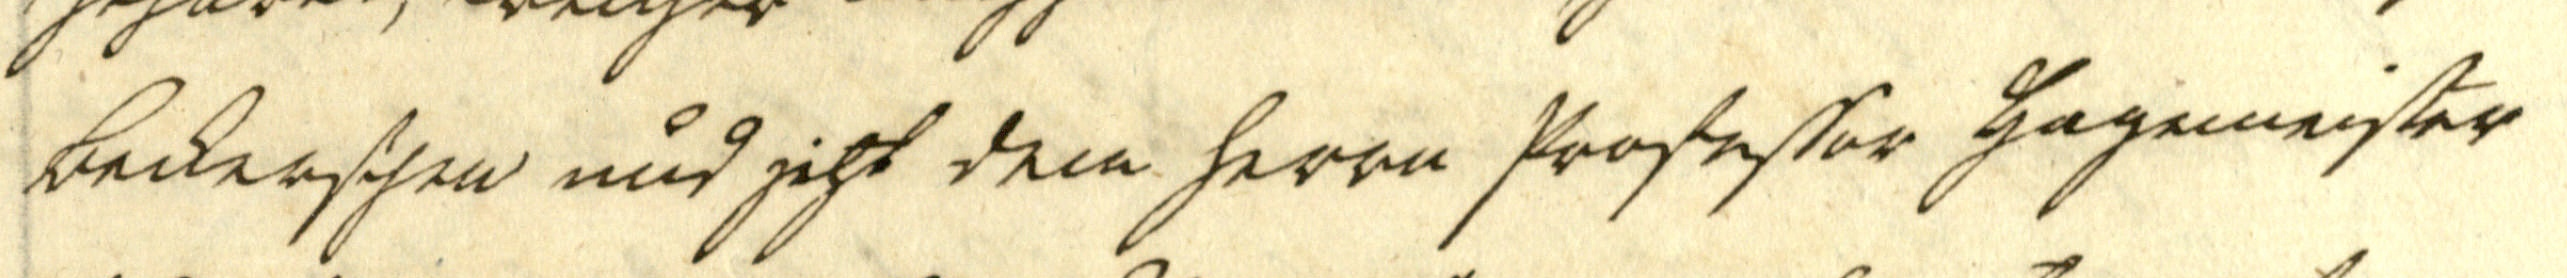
Beckerschen und jetzt dem Herrn Professor Hagemeister
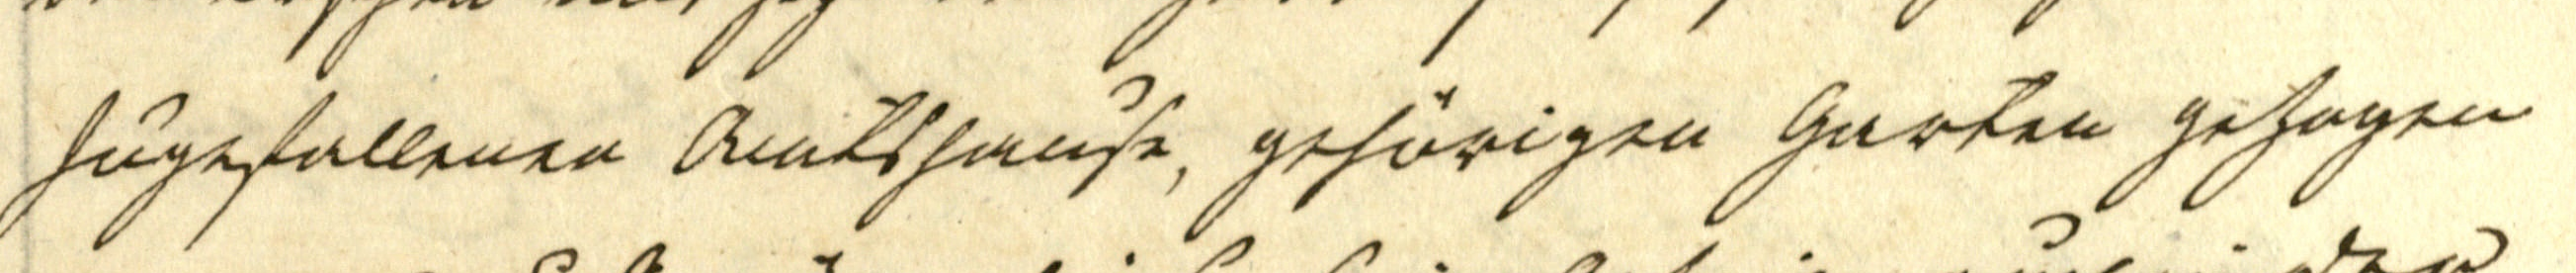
zugefallenen Amtshause, gehörigen Garten gezogen
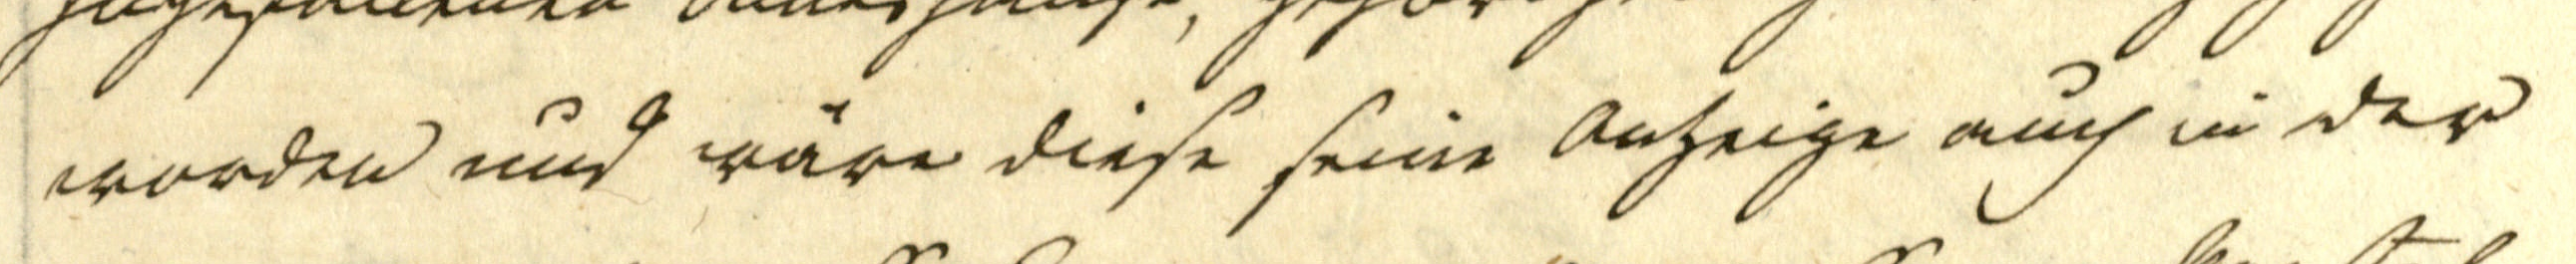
worden und wäre diese seine Anzeige auch in der
